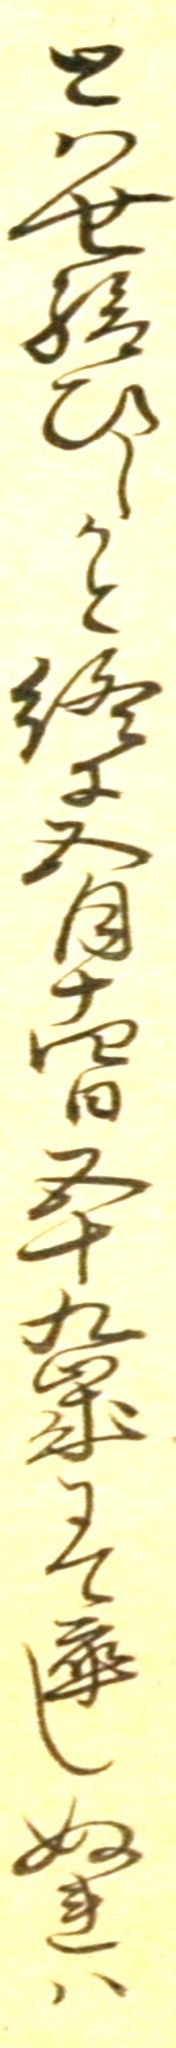とはせ給ひしかと終に五月十四日五十九歳にて卒しぬれは

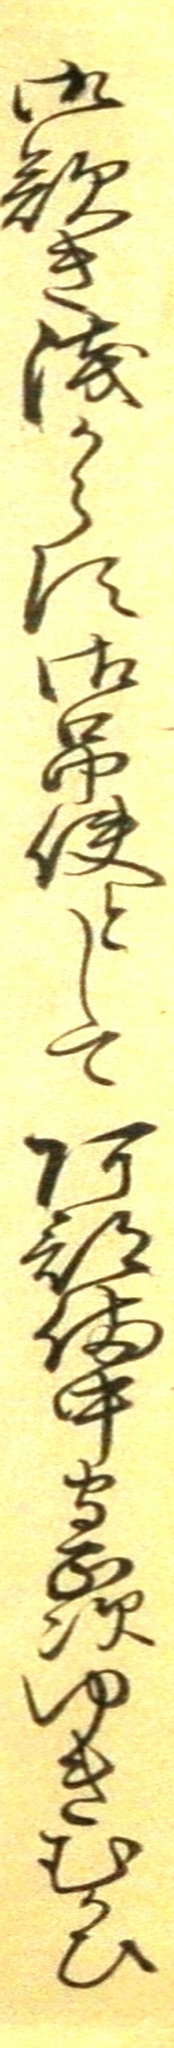御歎き浅からす御弔使として阿部備中守正次ゆきむかひ
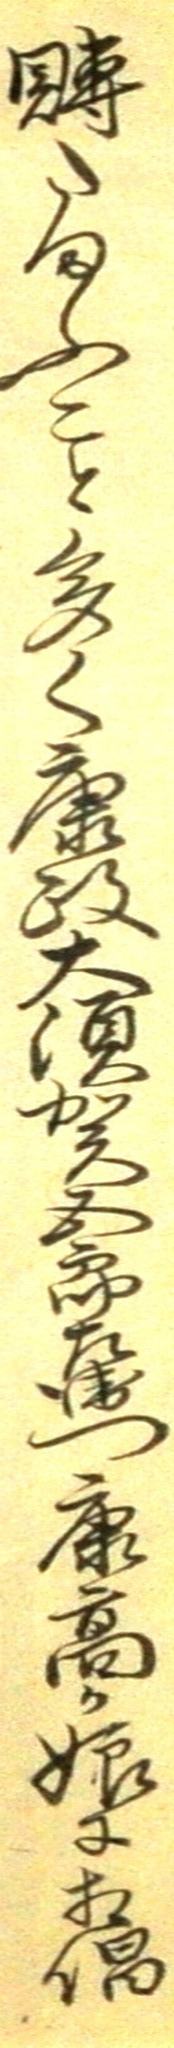賻たまふこと多く康政大須賀五郎左衛門康高か娘に相倡
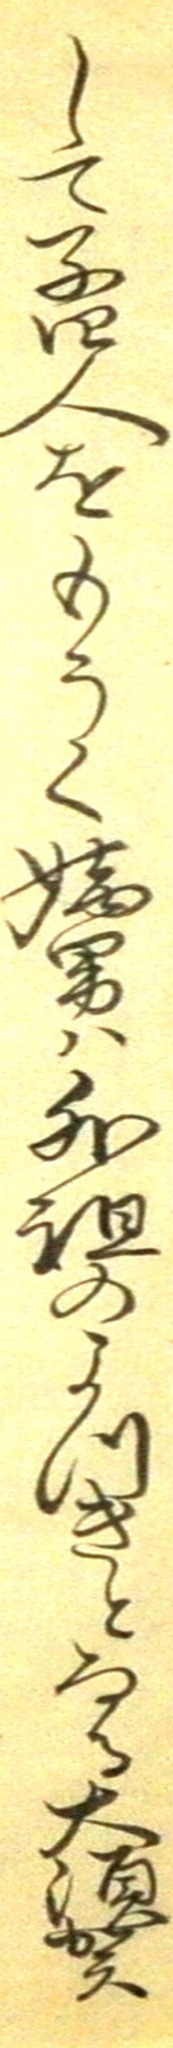して子四人をもうく嫡男は外祖のよつきとなる大須賀
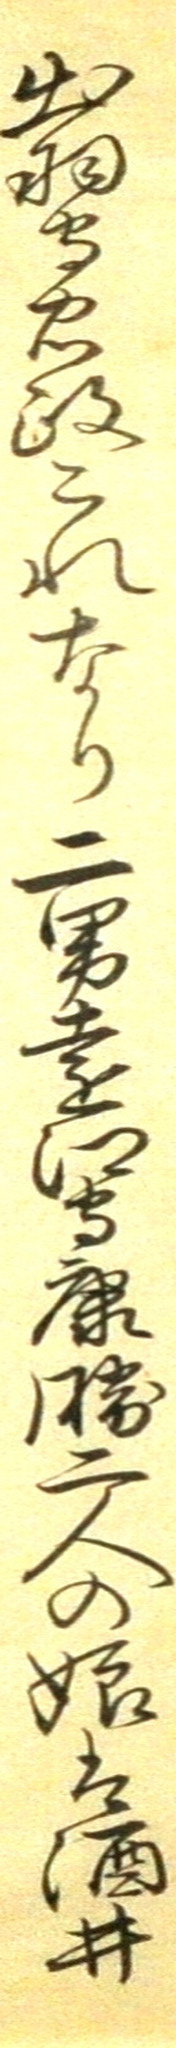出羽守忠政これなり二男遠江守康勝二人の娘は酒井
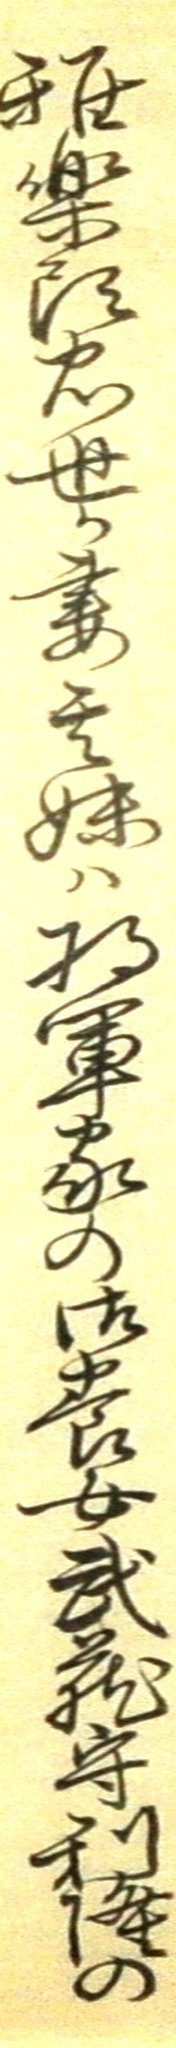雅楽頭忠世か妻其妹は将軍家の御養女武蔵守利隆の
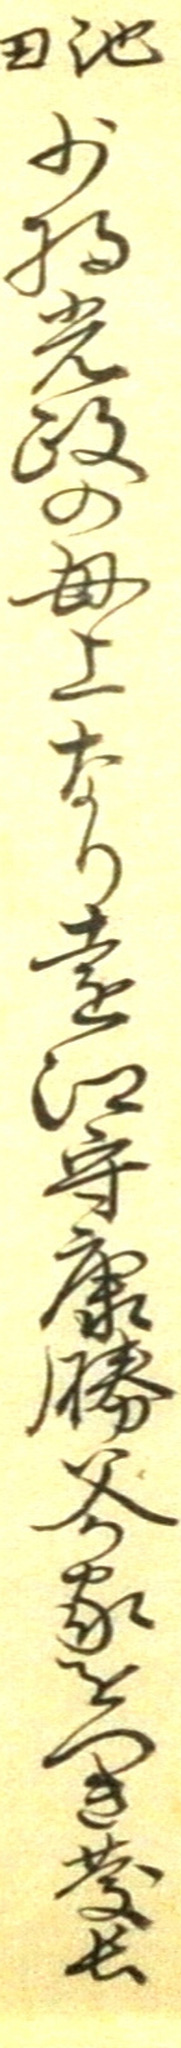室池田少将光政の母上なり遠江守康勝父か家をつき慶長
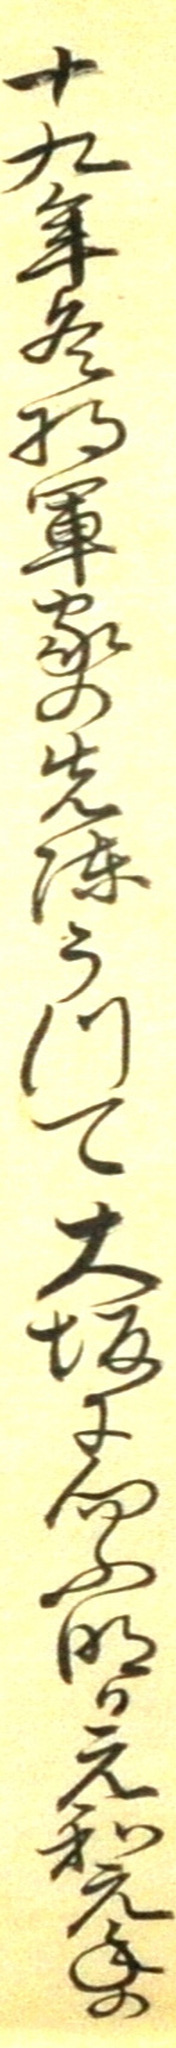十九年冬将軍家の先陣うつて大坂に向ふ明る元和元年の
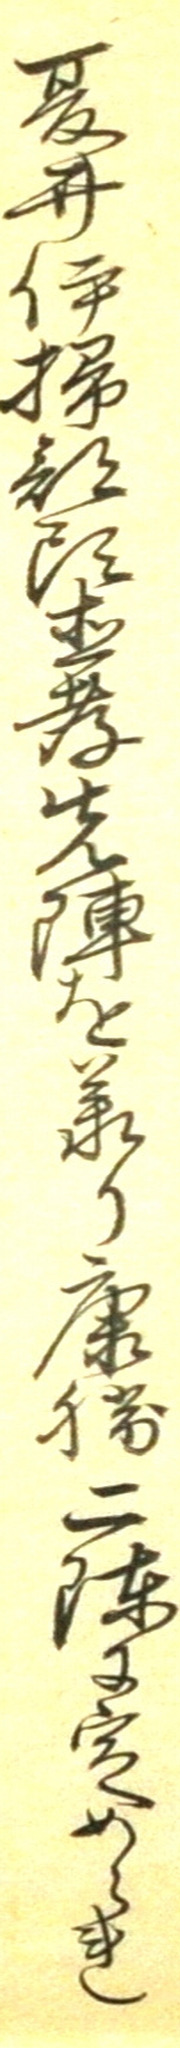夏井伊掃部頭直孝先陣を承り康勝二陣に定められ
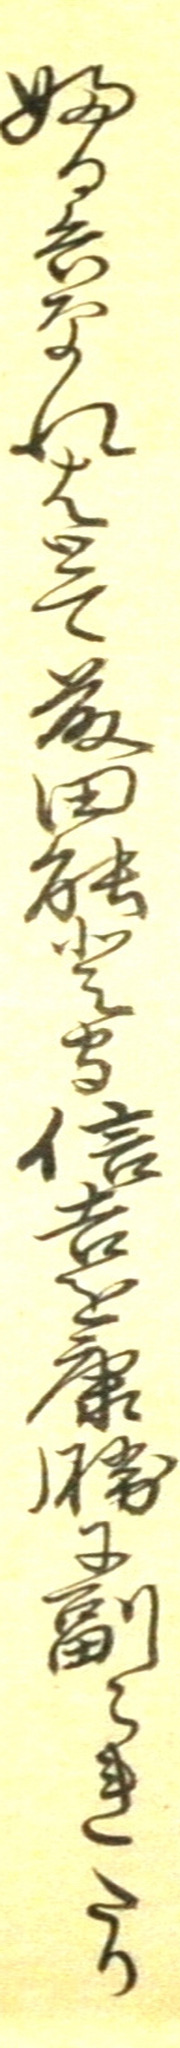ふる兵なれはとて藤田能登守信吉を康勝に副られたり
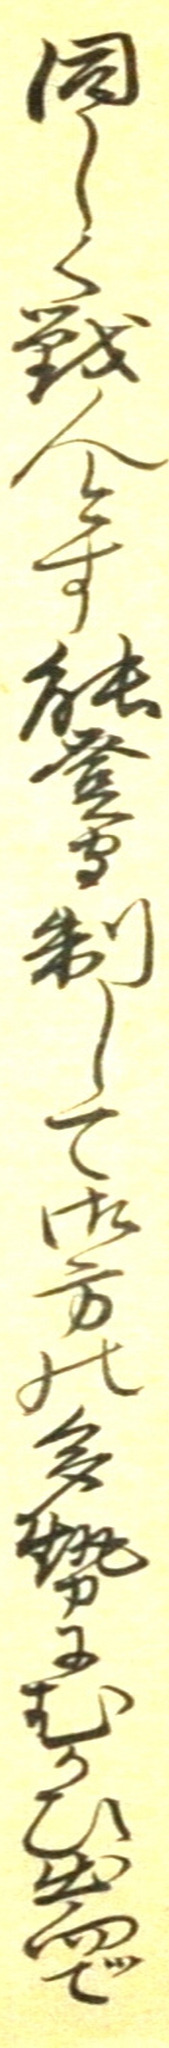同しく戦んとす能登守制して御方の多勢にむかひ出向て
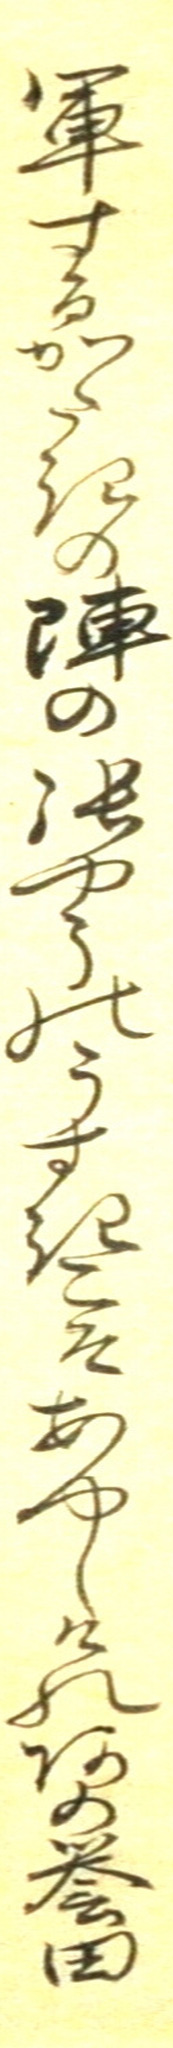軍するかたきの陣の張やうのうすきこそあやしけれあの誉田
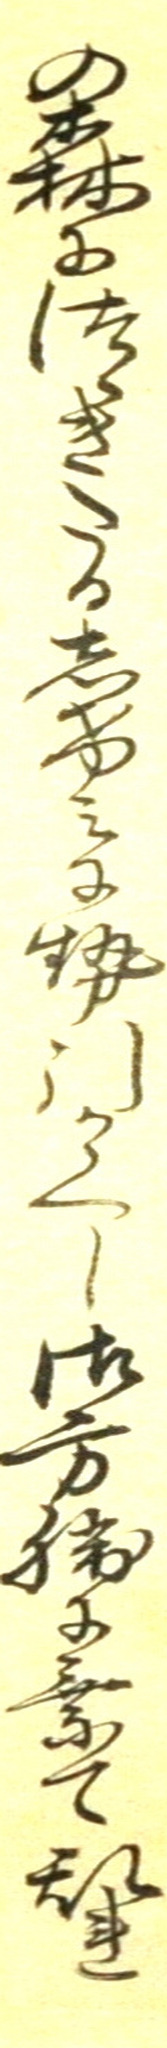の森につゝきたるしけみに勢引かくし御方勝に乗て乱れ
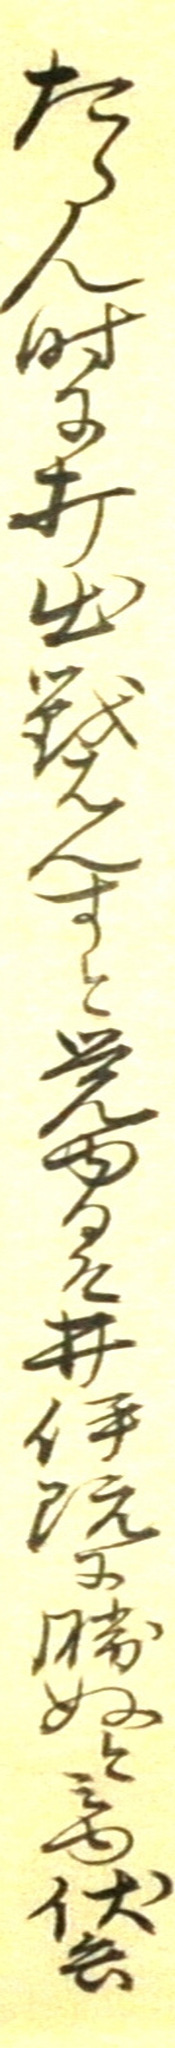たらん時に打出戦はんすと覚ゆるそ井伊既に勝ぬとみゆ伏兵
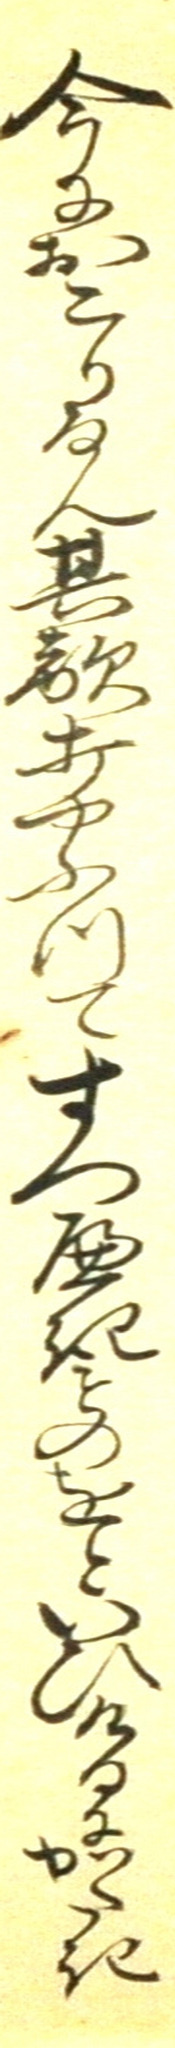今におこりなん其敵打やふつてすつへきものをといひけるにかたき
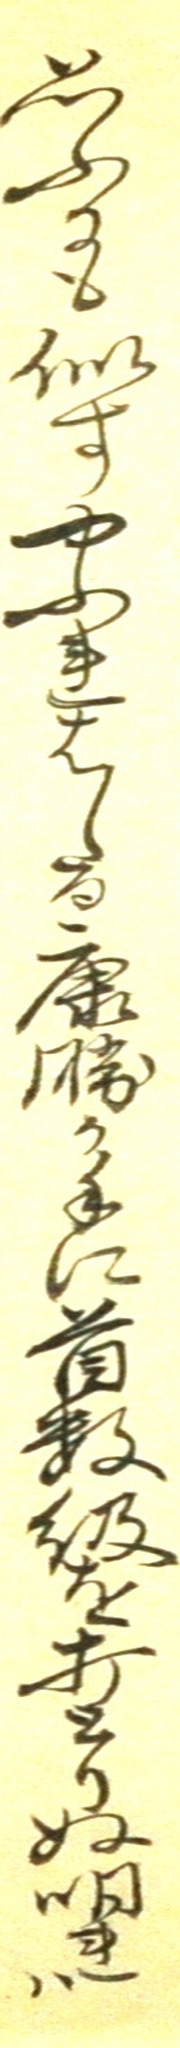思ふにも似すやふれはしたる康勝か手に首数級を打とりぬ明れは
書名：藩翰譜（四・上）
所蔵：伊那市立高遠町図書館・合同会社AMANE
